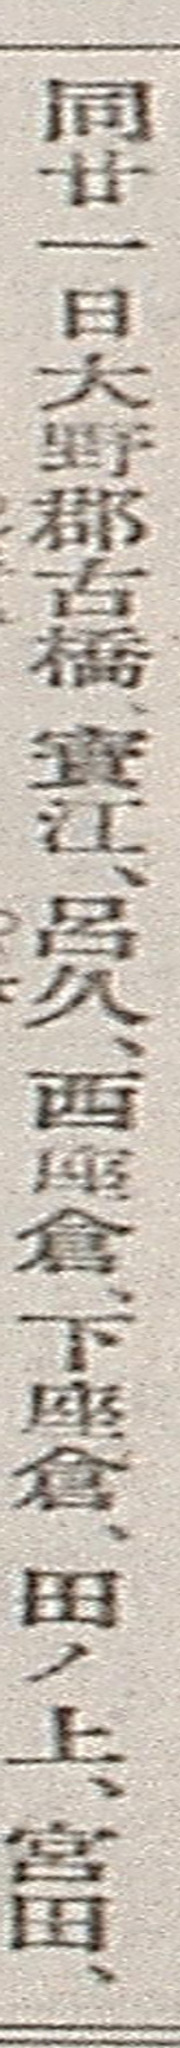同廿一日大野郡古橋、実江、呂久、西座倉、下座倉、田ノ上、宮田、
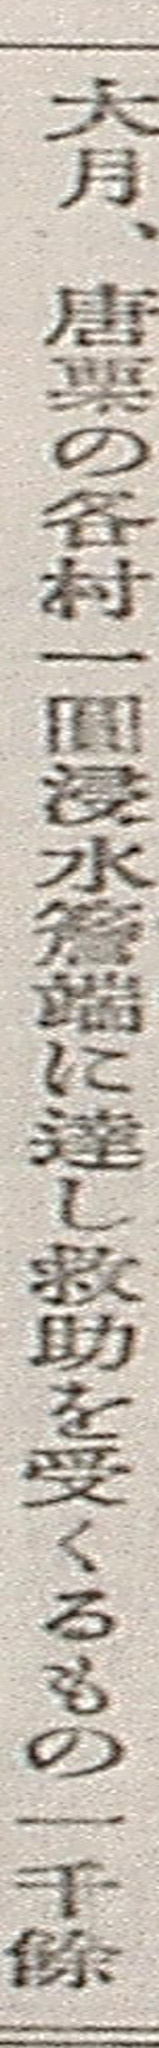大月、唐栗の各村一円浸水端に達し救助を受くるもの一千餘
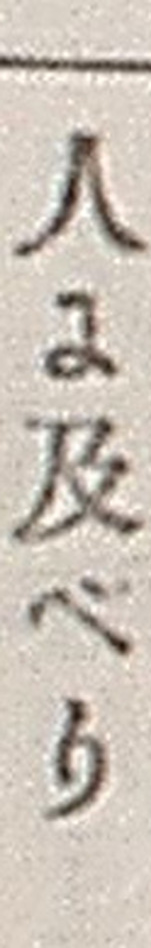人に及べり
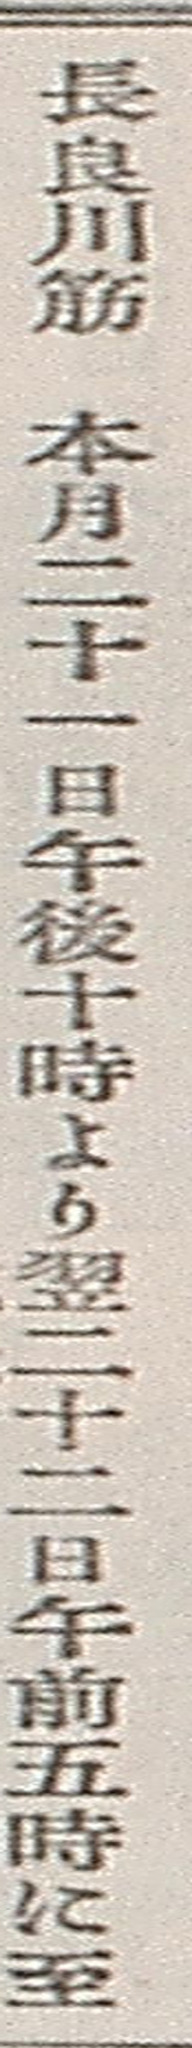長良川筋本月二十一日午後十時より翌二十二日午前五時に至
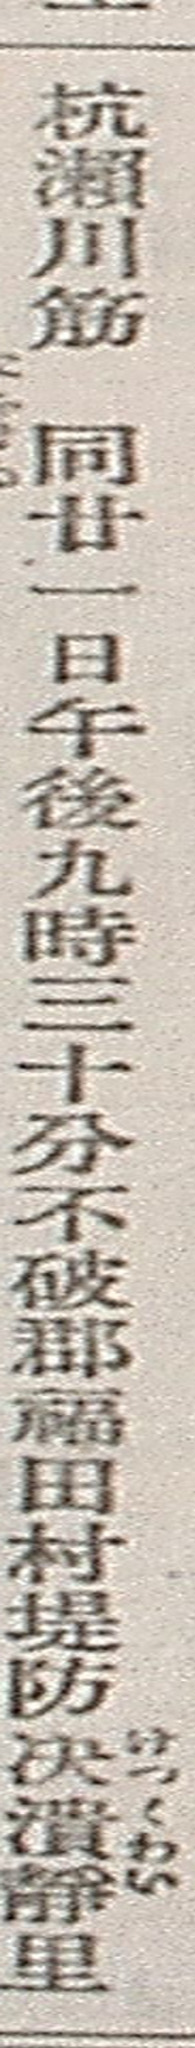杭瀬川筋同廿一日午後九時三十分不破郡福田村堤防决潰静里
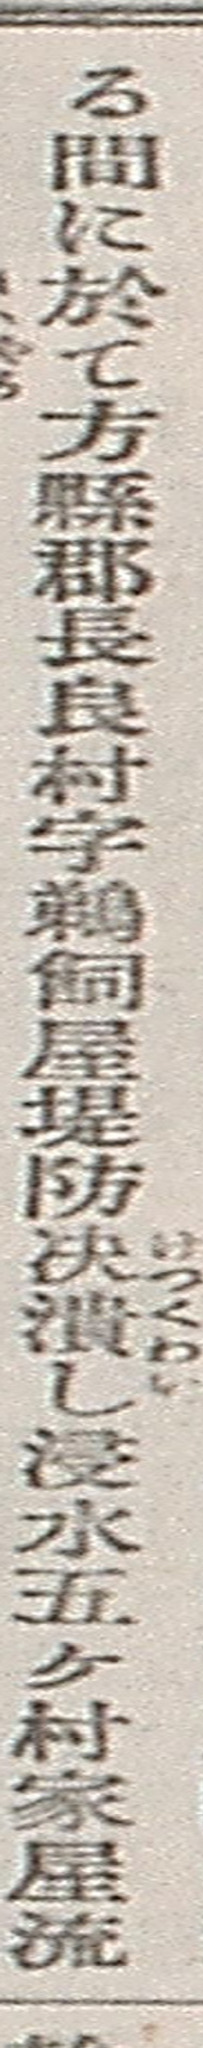る間に於て方縣郡長良村字鵜飼屋堤防决潰し浸水五ヶ村家屋流
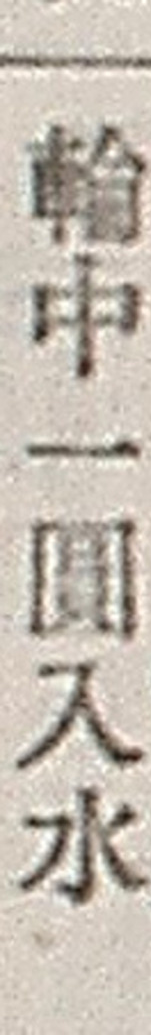輪中一円入水
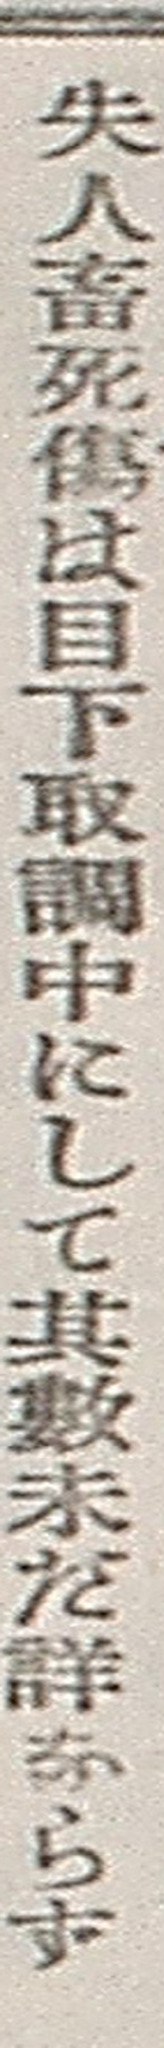失人畜死傷は目下取調中にして其数未だ詳ならず
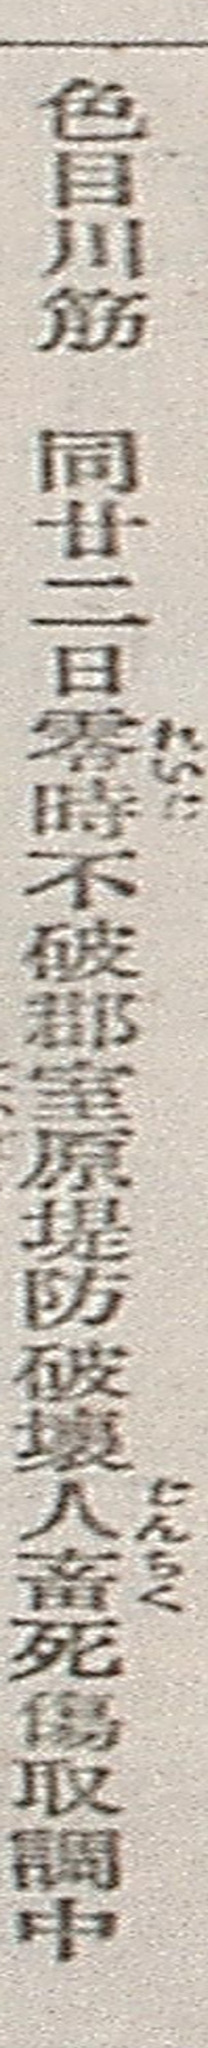色目川筋同廿日零時不破郡室原堤防破壊人畜死傷取調中
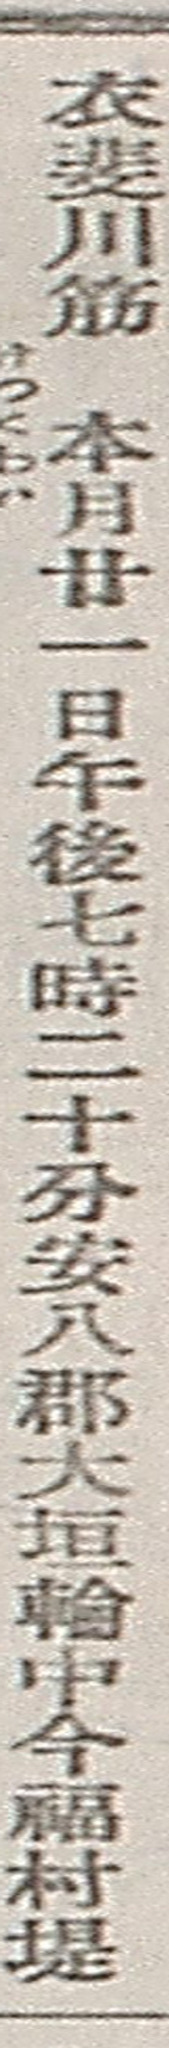衣斐川筋本月廿一日午後七時二十分安八郡大垣輪中今福村堤
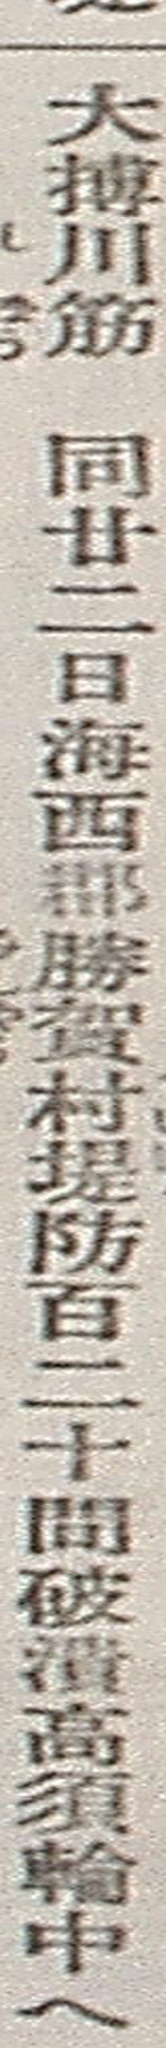大搏川筋同廿二日海西郡勝賀村堤防百二十間破潰高須輪中へ
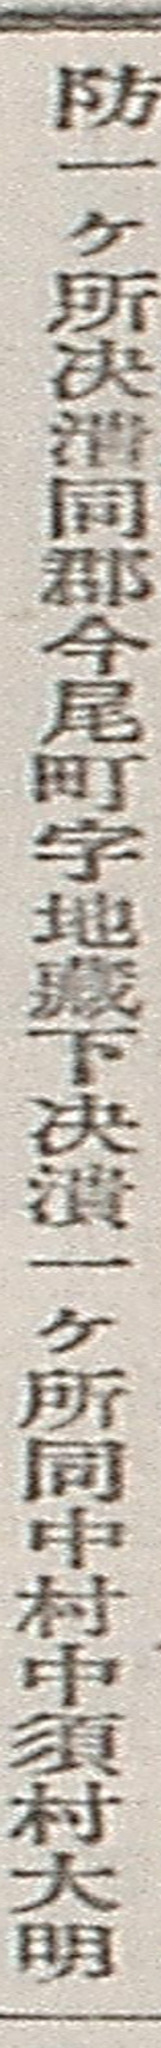防一ヶ所决潰同郡今尾町字地蔵下决潰一ヶ所同中村中須村大明
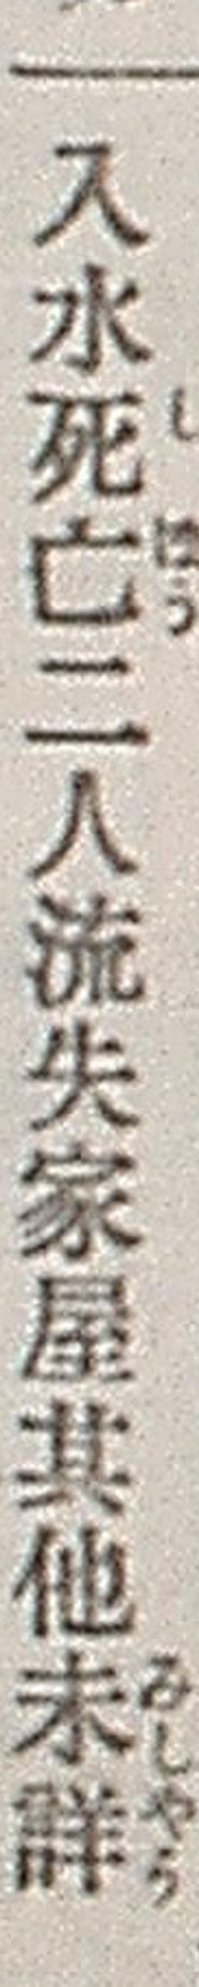入水死亡二人流失家屋其他未詳

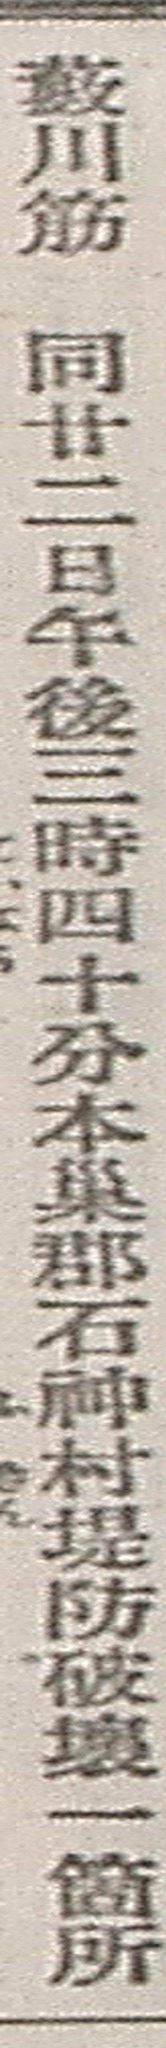薮川筋同廿二日午後三時四十分本巣郡石神村堤防一箇所
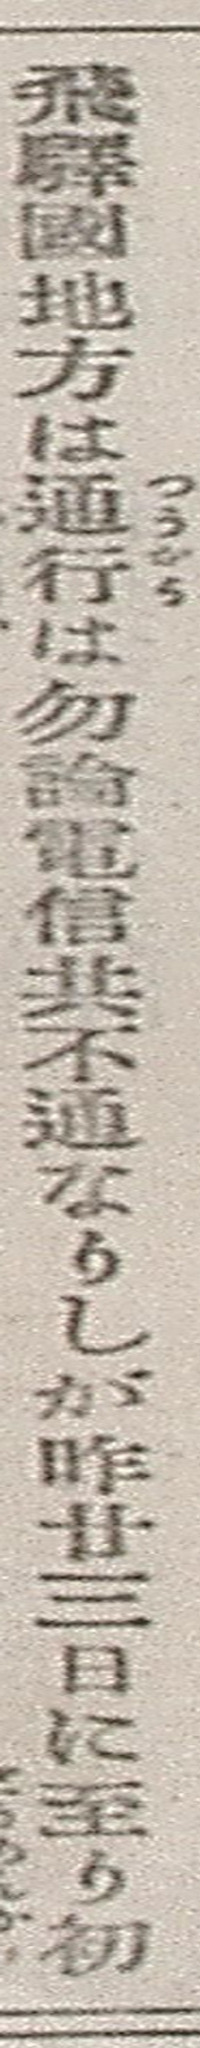飛騨国地方は通行は勿論電信共不通なりしが昨廿日に至り初
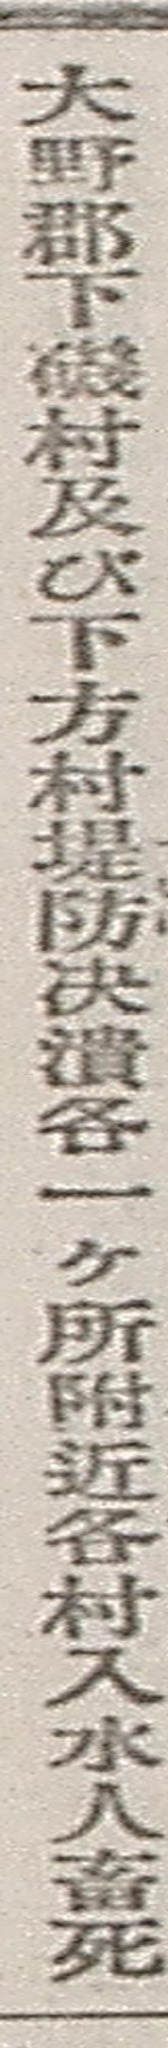大野郡下磯村及び下方村堤防决潰各一ヶ所附近各村入水人畜死
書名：風俗畫報臨時増刊第百二十六號　洪水被害録（中）
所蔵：東京大学地震研究所図書室 Earthquake Research Institute Library, The University of Tokyo, JAPAN
